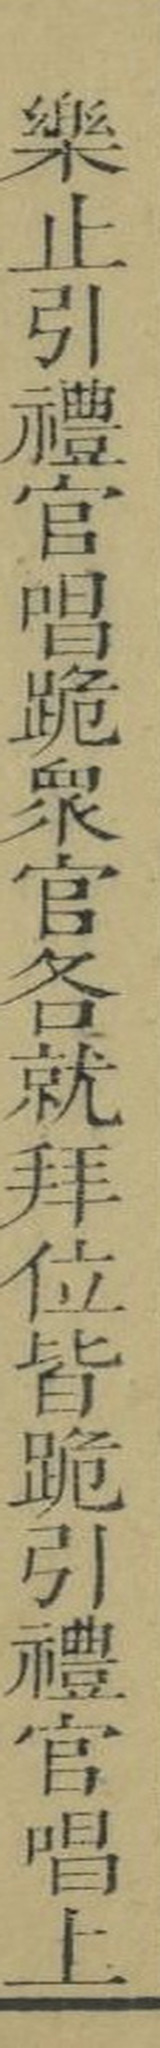樂止引禮官唱跪衆官各就拜位皆跪引禮官唱上
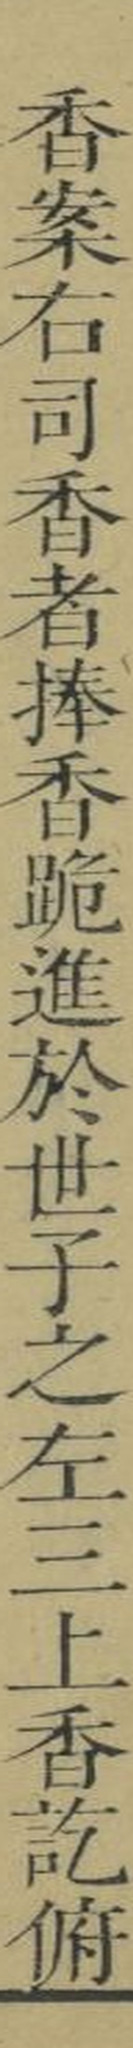香案右司香者捧香跪進於世子之左三上香訖俯
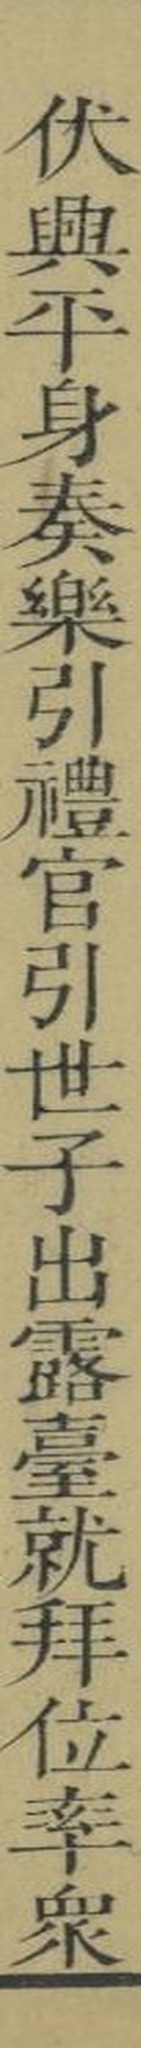伏興平身奏樂引禮官引世子出露臺就拜位率衆
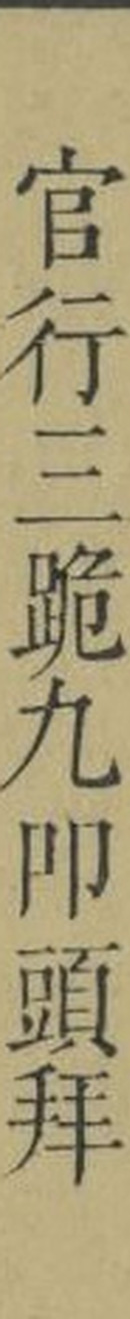官行三跪九叩頭拜
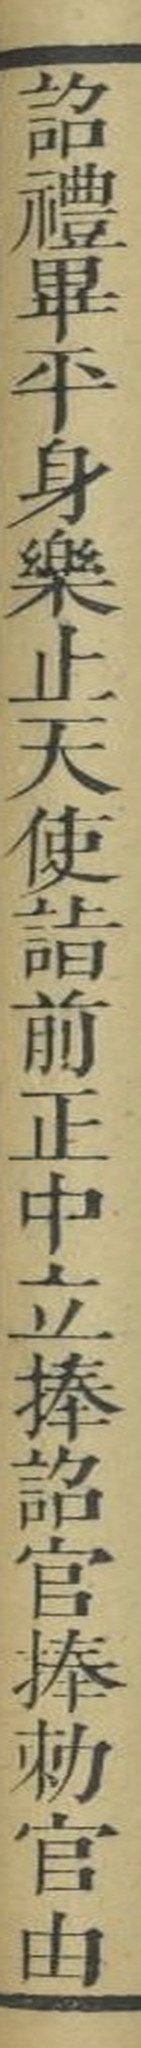詔禮畢平身樂止天使詣前正中立捧詔官捧勅官由
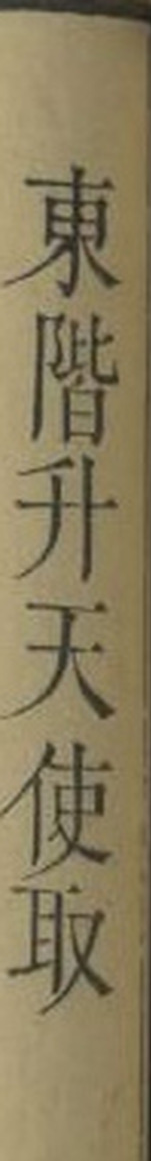東階升天使取
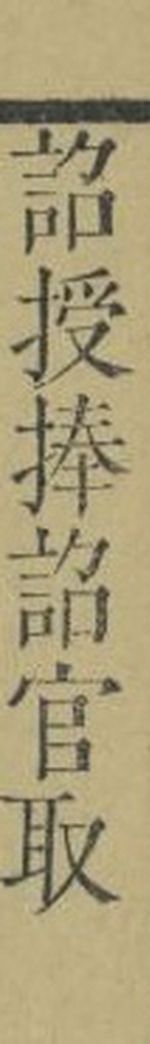詔授捧詔官取
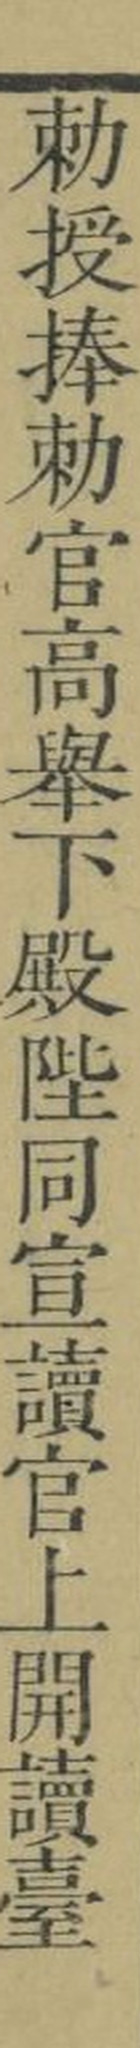勅授捧勅官高舉下殿陛同宣讀官上開讀臺
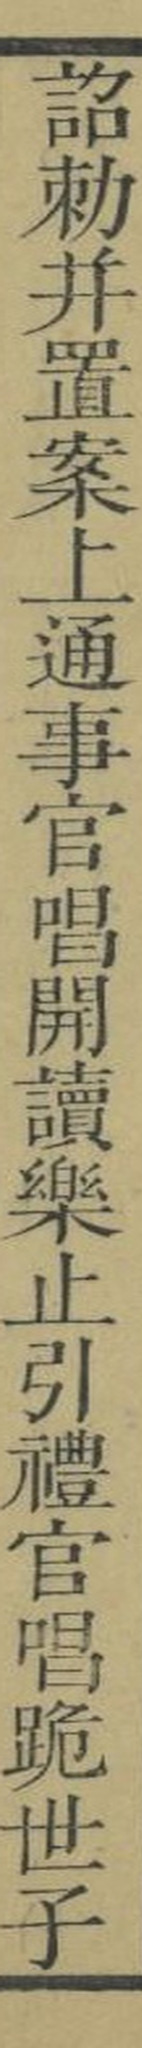詔勅并置案上通事官唱開讀樂止引禮官唱跪世子
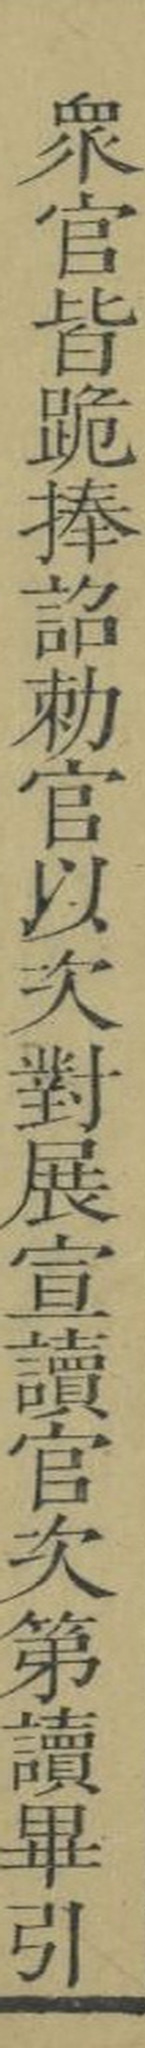衆官皆跪捧詔勅官以次對展宣讀官次第讀畢引
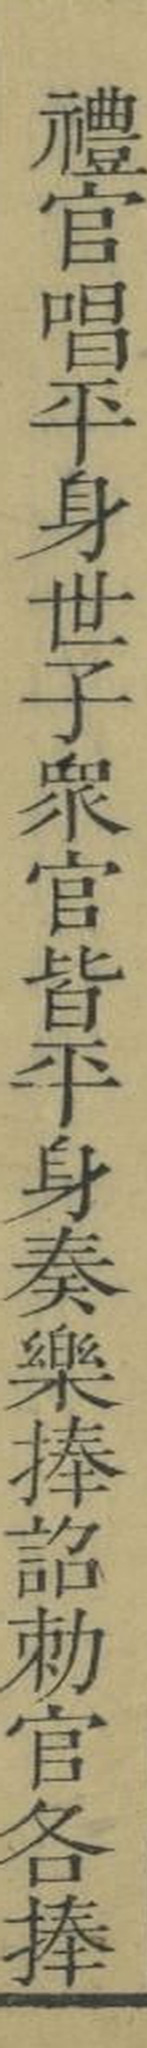禮官唱平身世子衆官皆平身奏樂捧詔勅官各捧
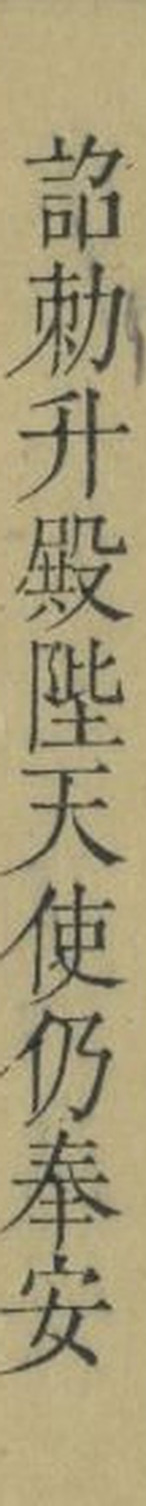詔勅升殿陛天使仍奉安
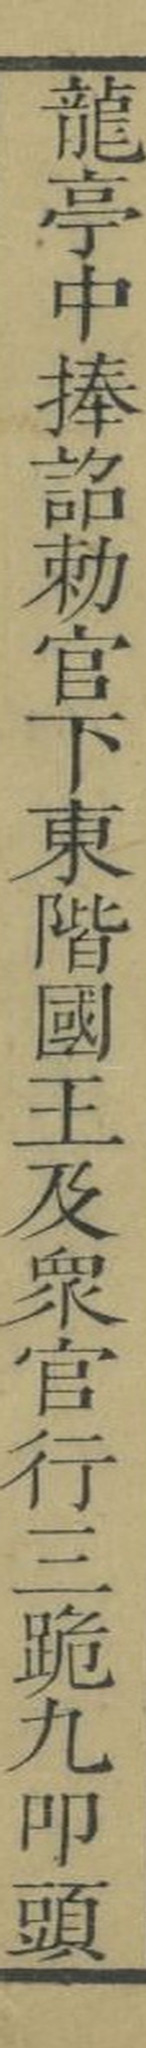龍亭中捧詔勅官下東階國王及衆官行三跪九叩頭
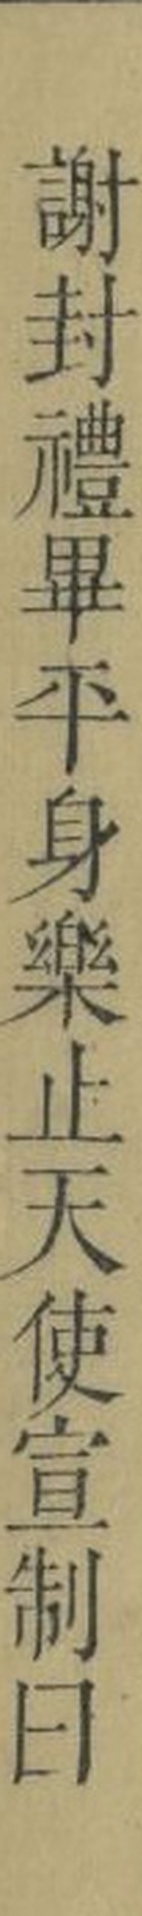謝封禮畢平身樂止天使宣制曰

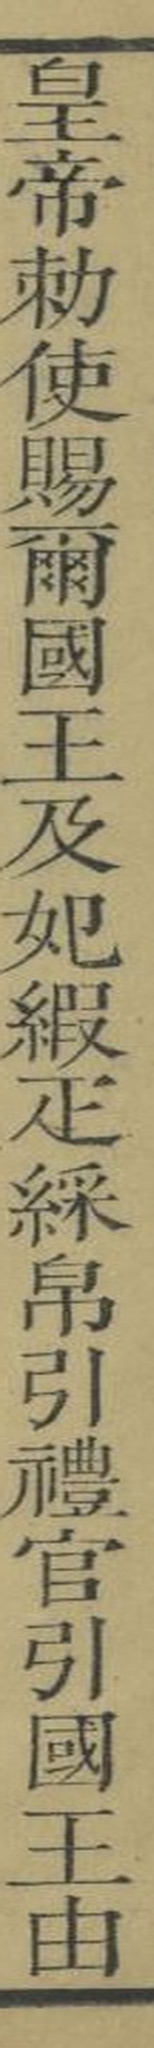皇帝勅使賜爾國王及妃縀疋綵帛引禮官引國王由
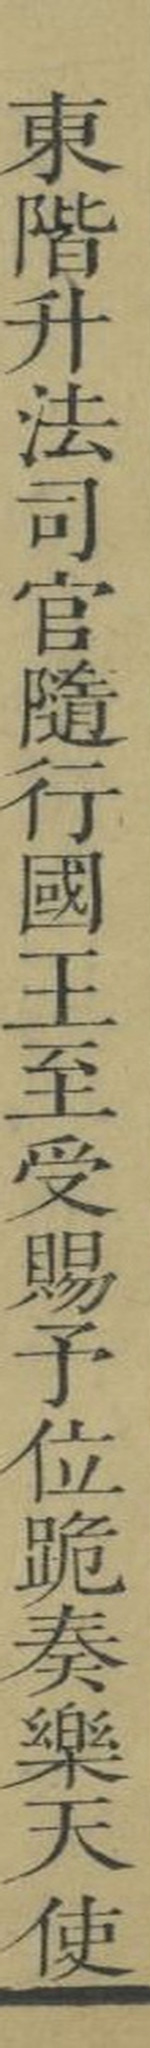東階升法司官隨行國王至受賜予位跪奏樂天使
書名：中山伝信録 巻二
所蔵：University of the Ryukyus Library
